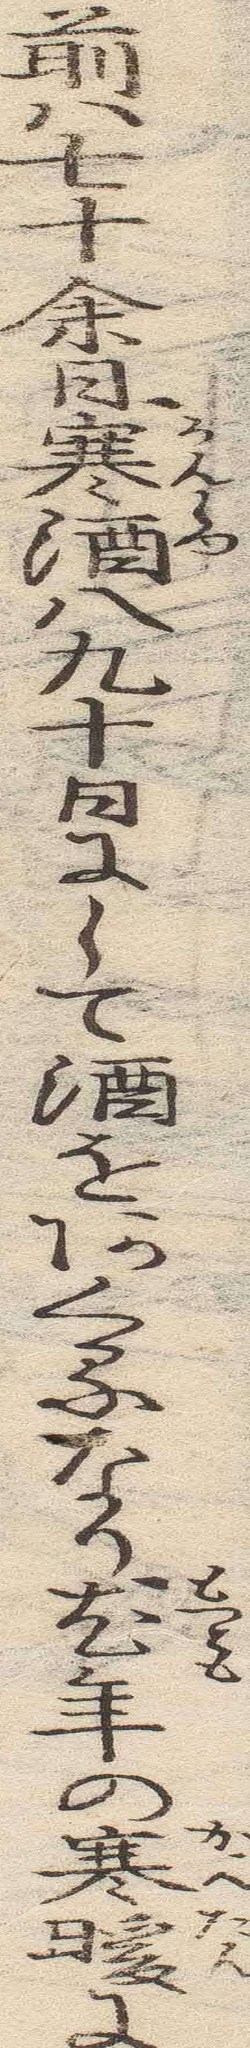前は七十余日。寒酒八九十日にして酒をあくるなり。尤年の寒暖に
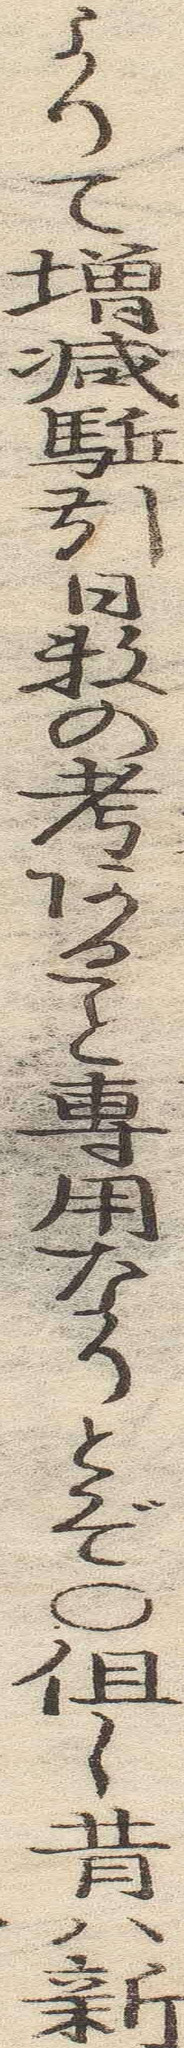よりて増減駆引日数の考あること専用なりとぞ○但し昔は新
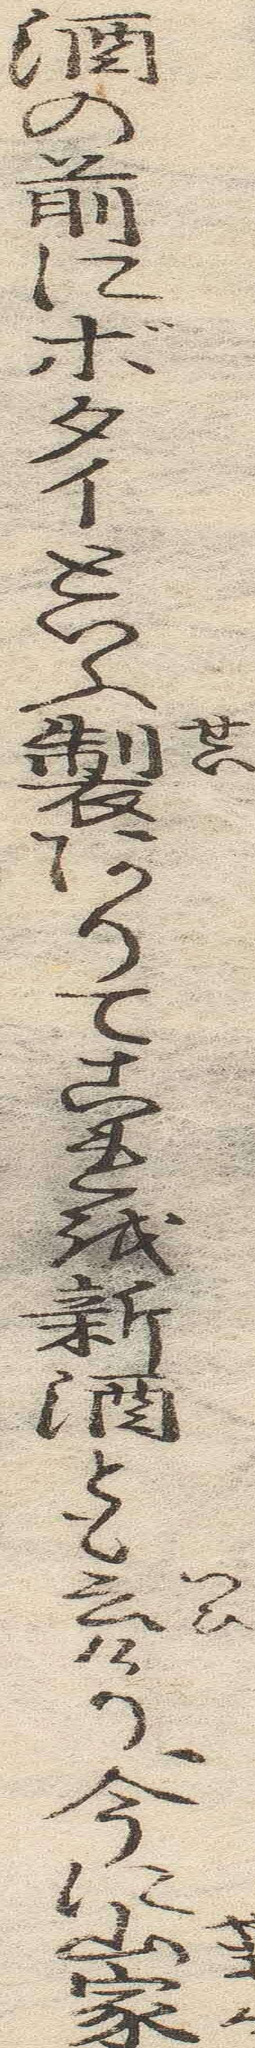酒の前にボタイといふ製ありてこれを新酒とも云けり。今に山家
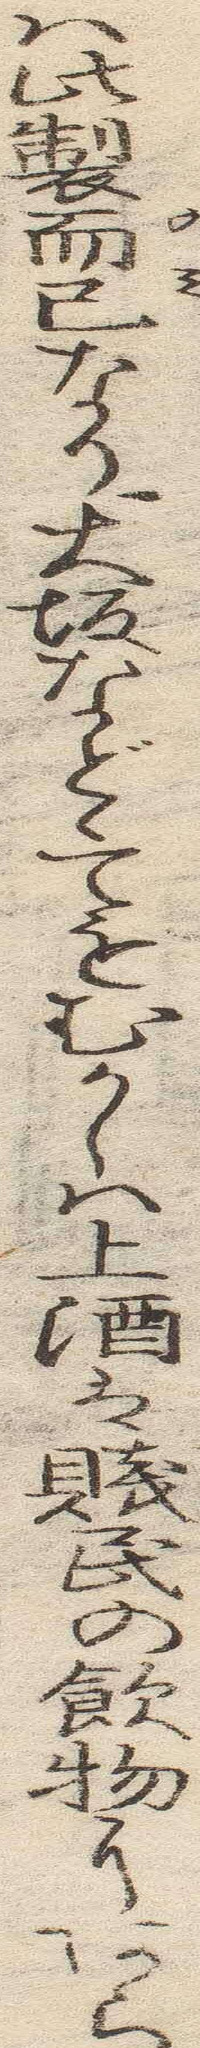は此製而已なり。大坂などゝてもむかしは上酒は賎民の飲物にあら
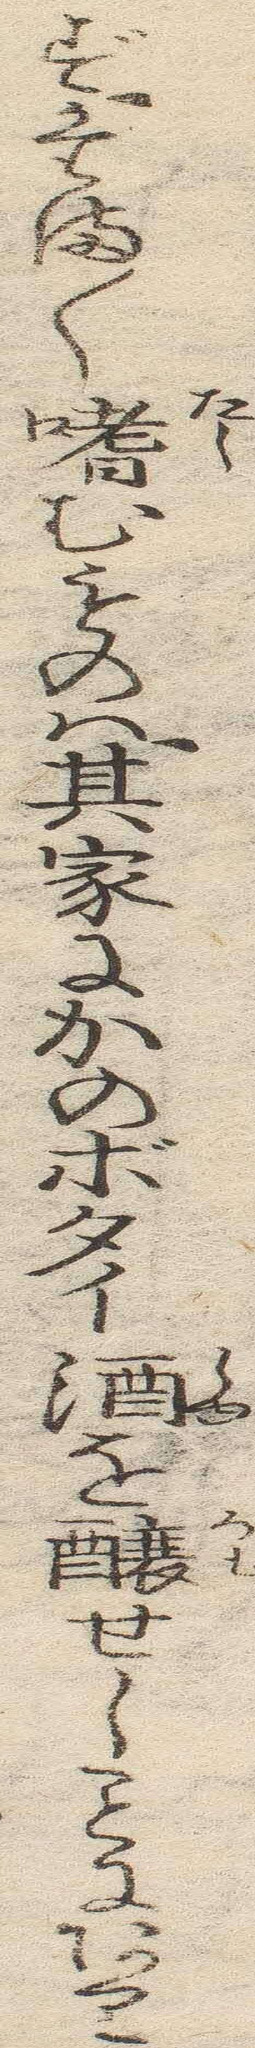ず。たま〳〵嗜むものは。其家にかのボタイ酒を醸せしことにあり
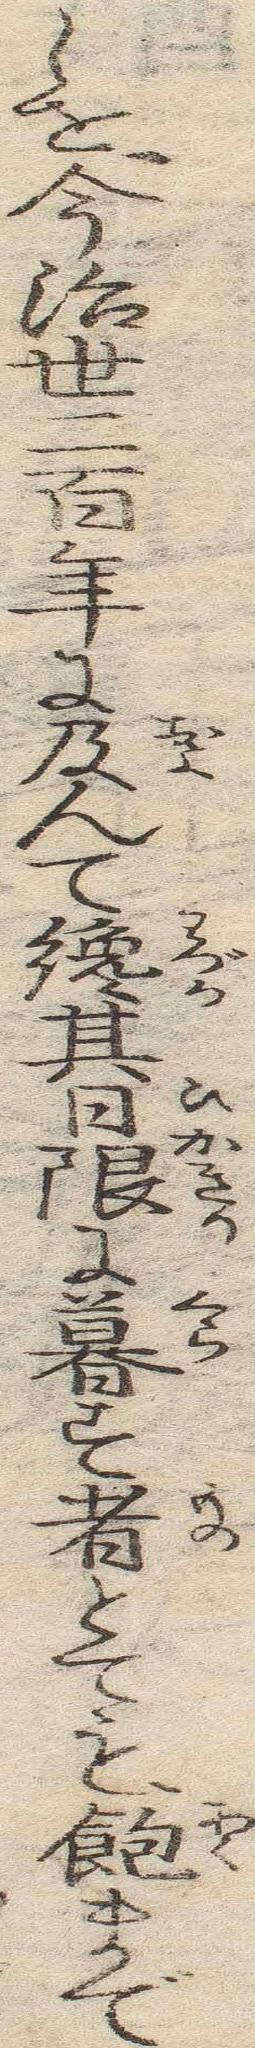しを。今治世二百年に及んて纔其日限に暮す者とても。飽まで
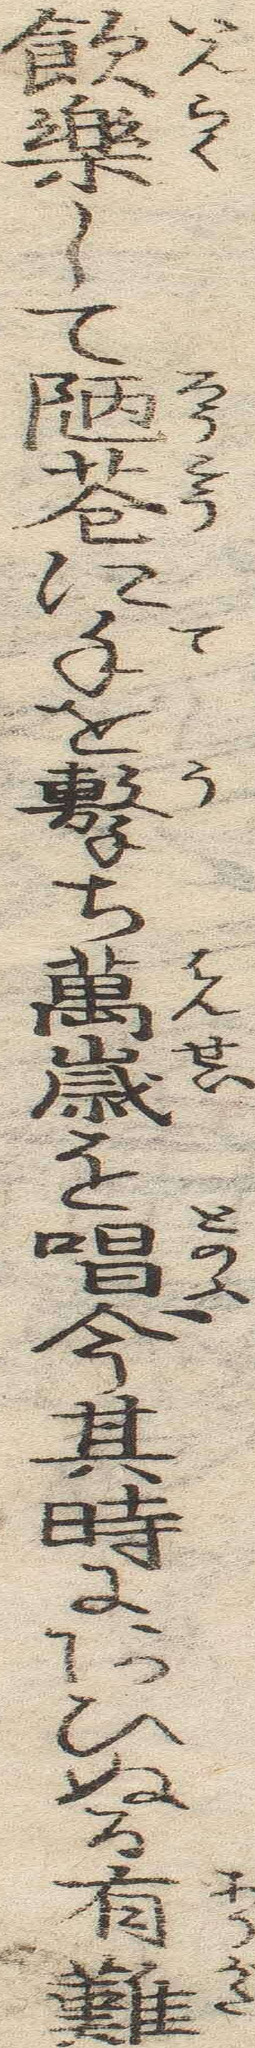飲楽して陋巷に手を撃ち万歳を唱。今其時にあひぬる有難
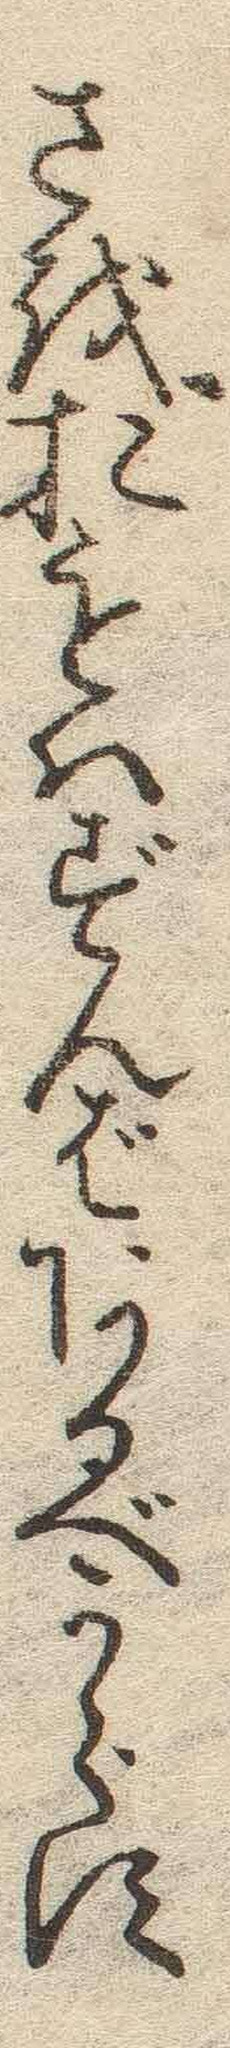さをおもはずんばあるべからす
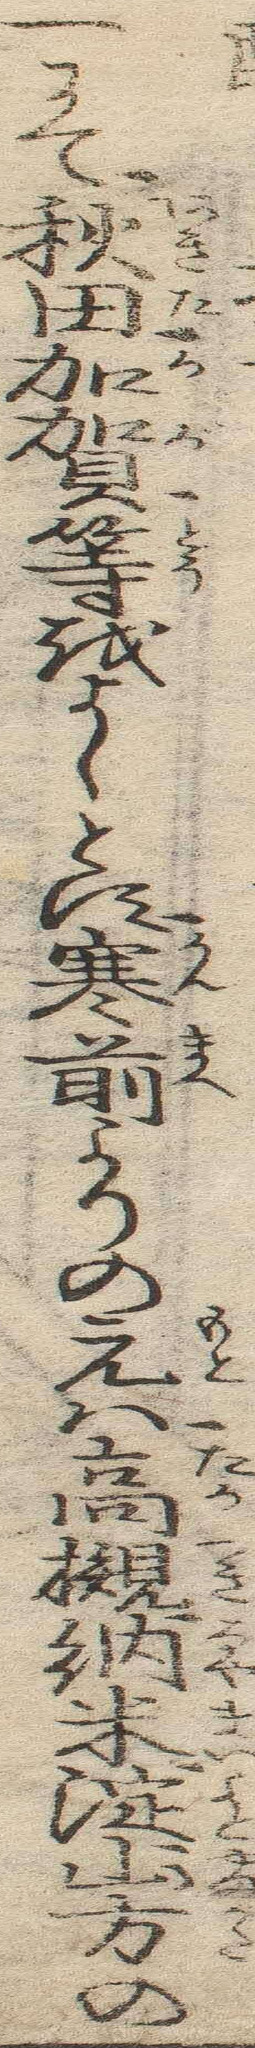一にて秋田。加賀。等をよしとす。寒前よりの元は。高槻。納米。淀。山方の
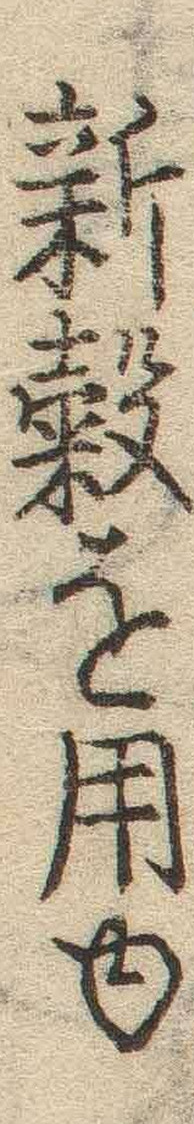新穀を用ゆ

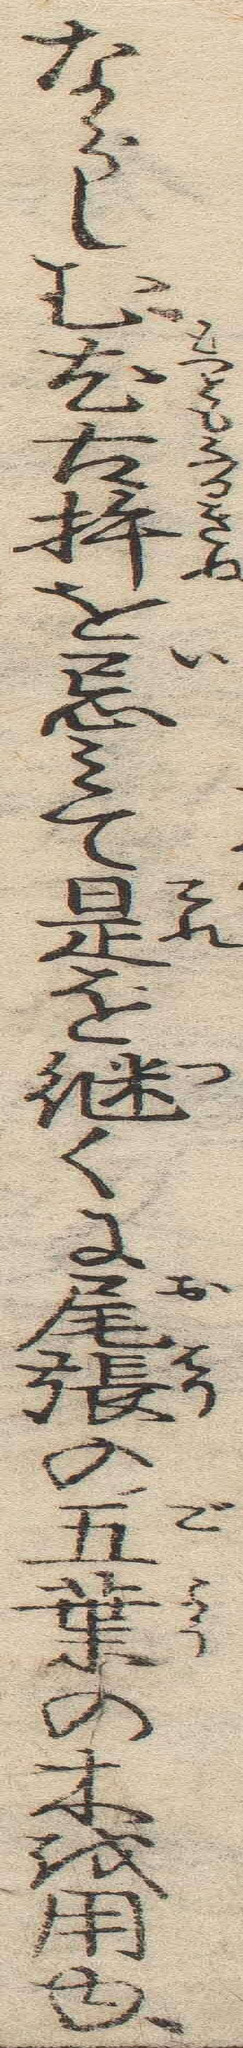ならしむ。尤古杵を忌みて是を継くに尾張の五葉の木を用ゆ。
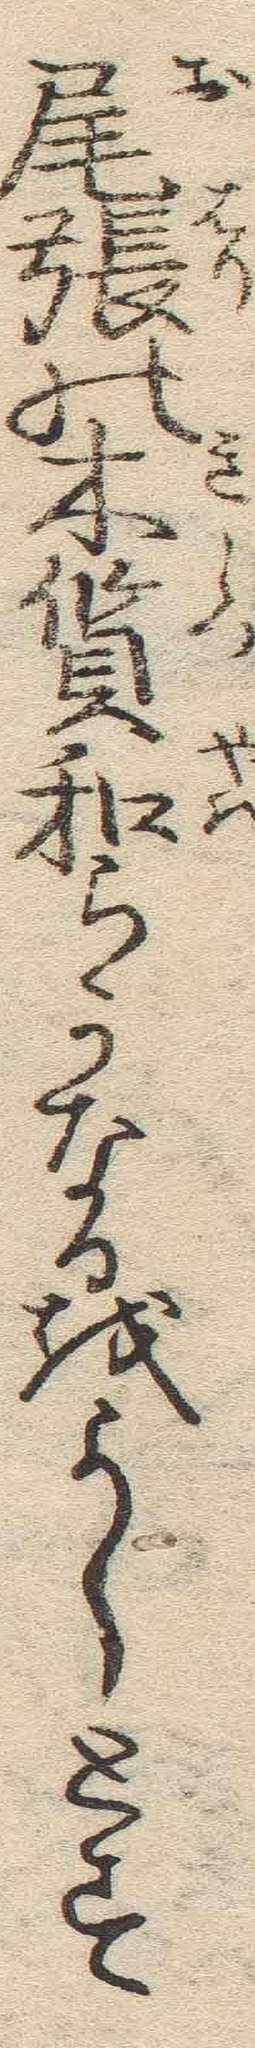尾張の木質和らかなるをよしとす
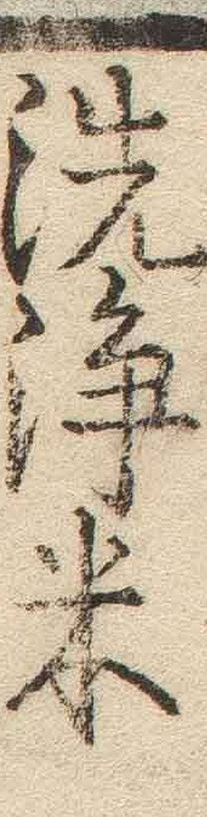洗浄米
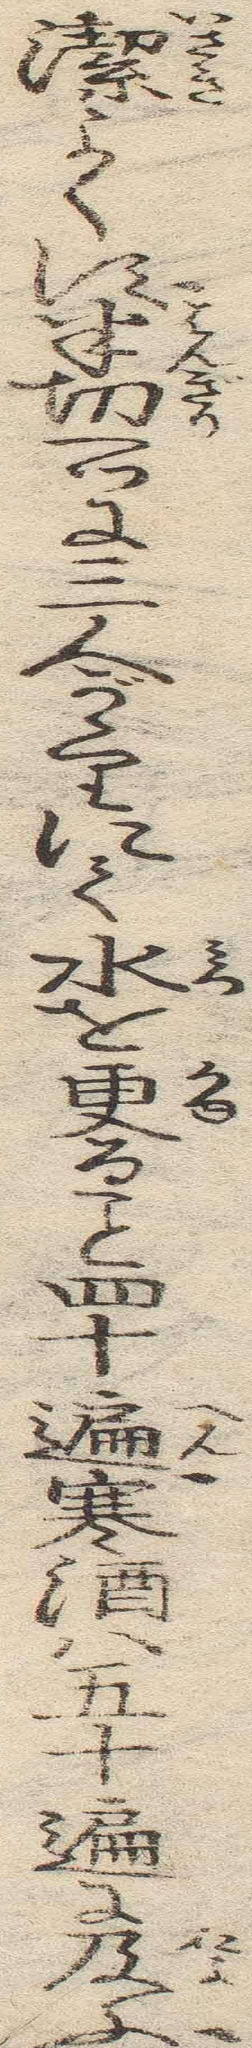潔よくす。半切一つに三人がゝりにて水を更ること四十遍。寒酒は五十遍に及ふ。
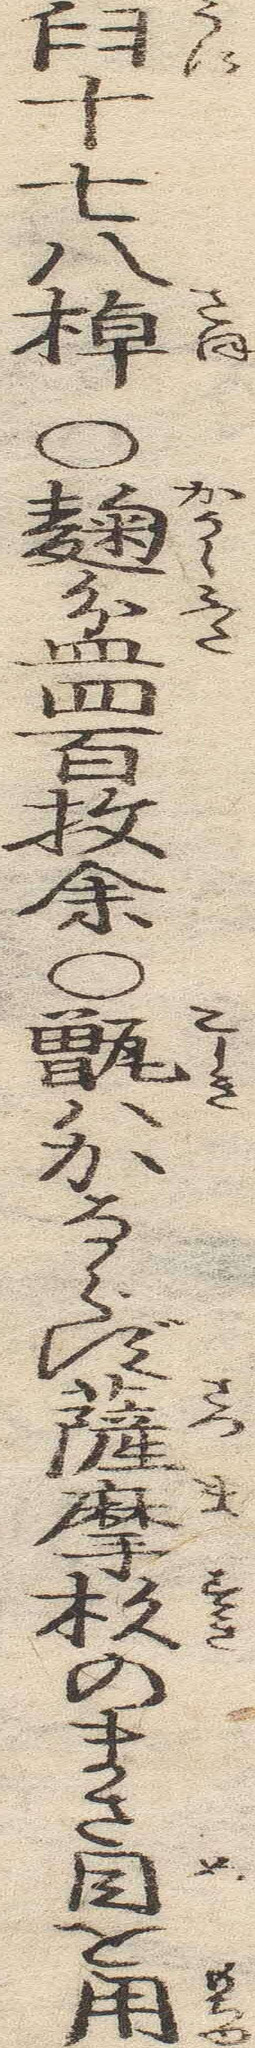臼十七八棹○麹盆四百枚余○甑はかならず薩摩杉のまさ目を用
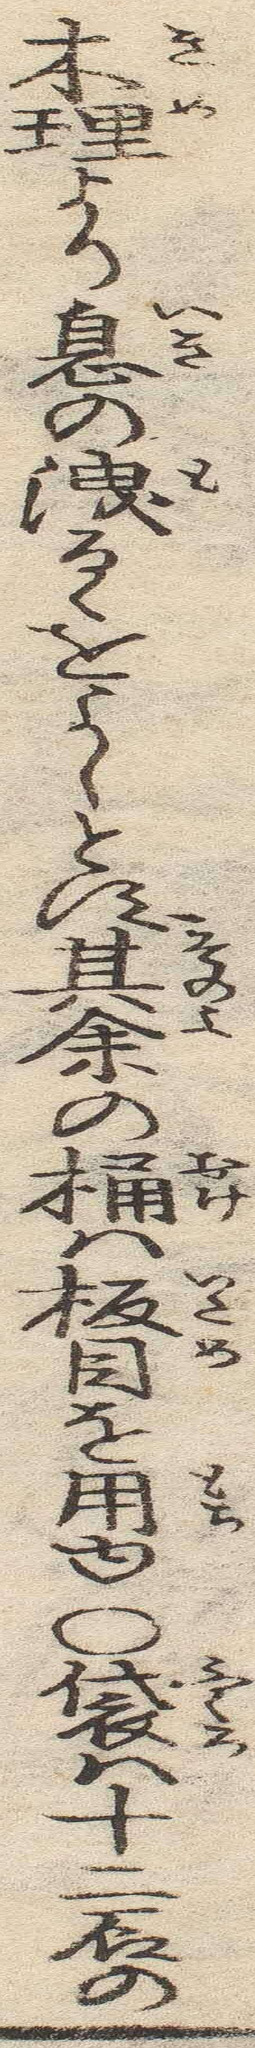木理より息の洩るゝをよしとす。其余の桶は板目を用ゆ○袋は十二石の
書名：日本山海名産図会
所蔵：東京学芸大学附属図書館 国文学研究資料館
